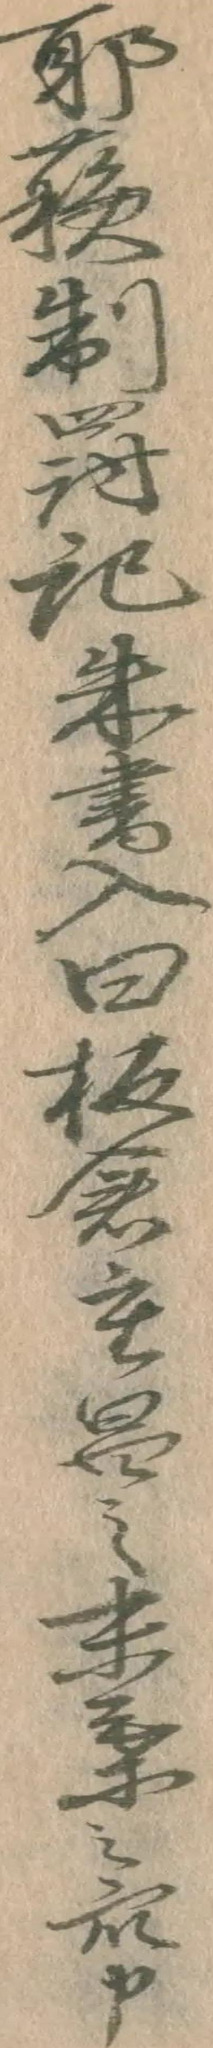耶蘇制罰記朱書入曰板倉重政重昌之末葉之衆申
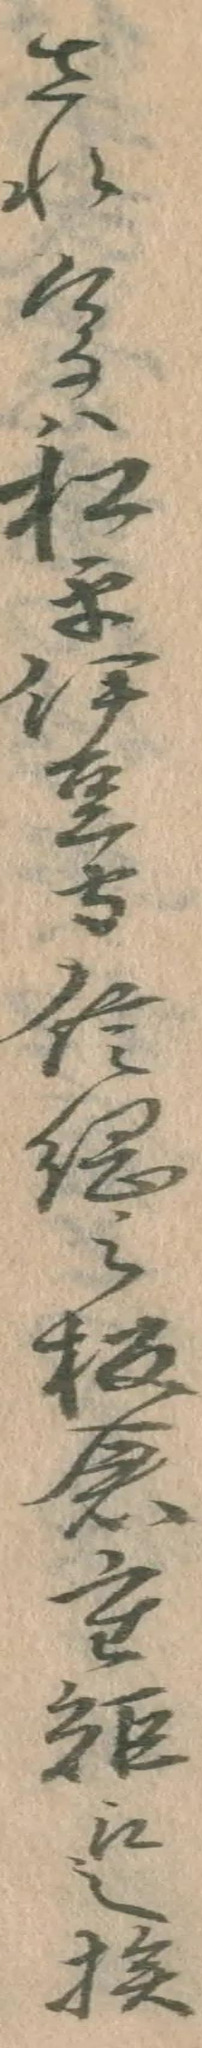されけるは松平伊豆守信綱之板倉重矩江之挨
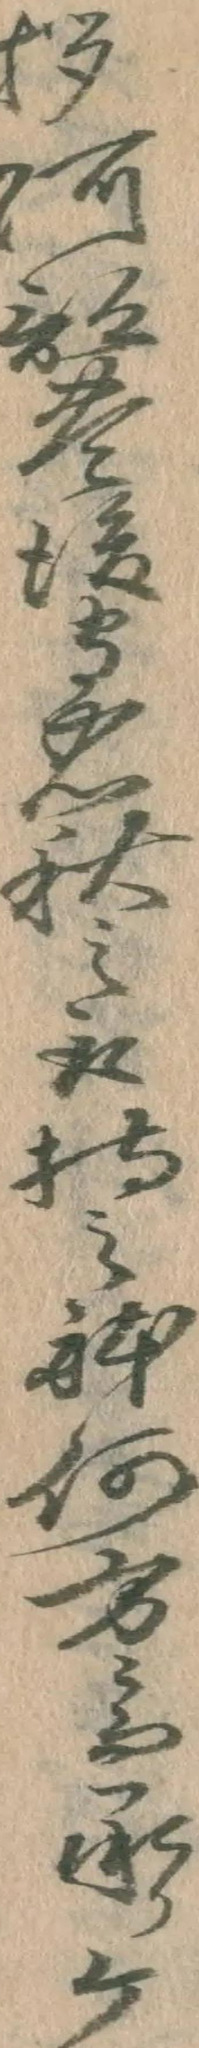拶阿部豊後守忠秋之取持之躰何方に而承りけ
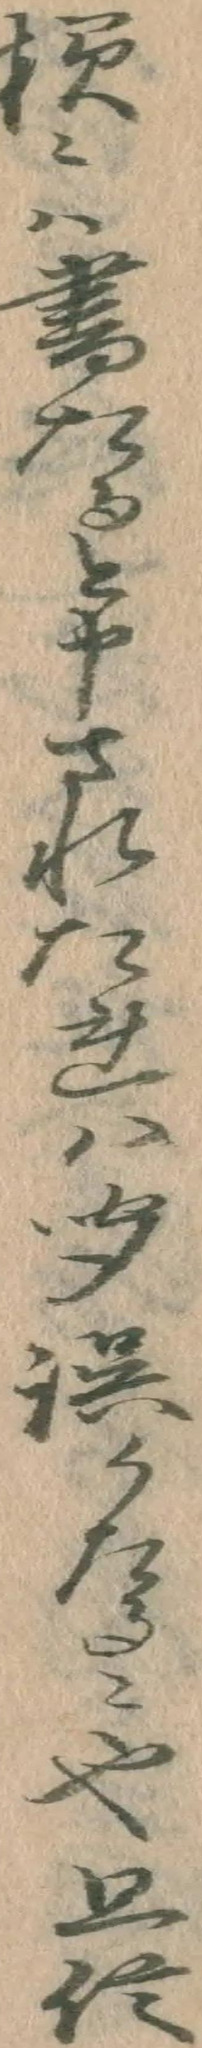様には書たると申された連は聞誤りたるにや且信
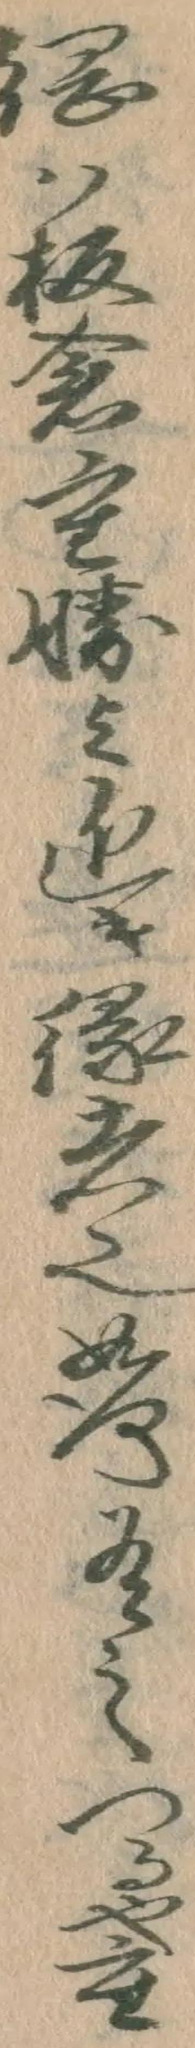綱は板倉重勝与近き縁者也如何有之つるや重
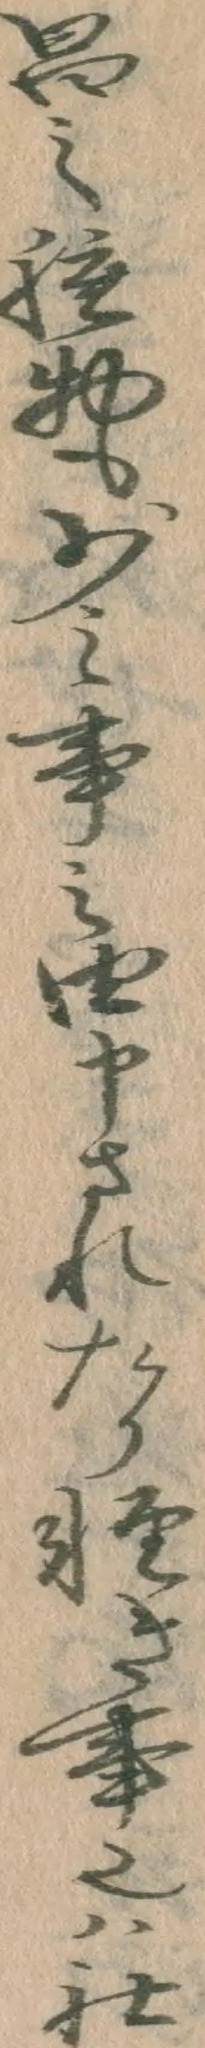昌之種物も少之事之由申されたり軽き事也被
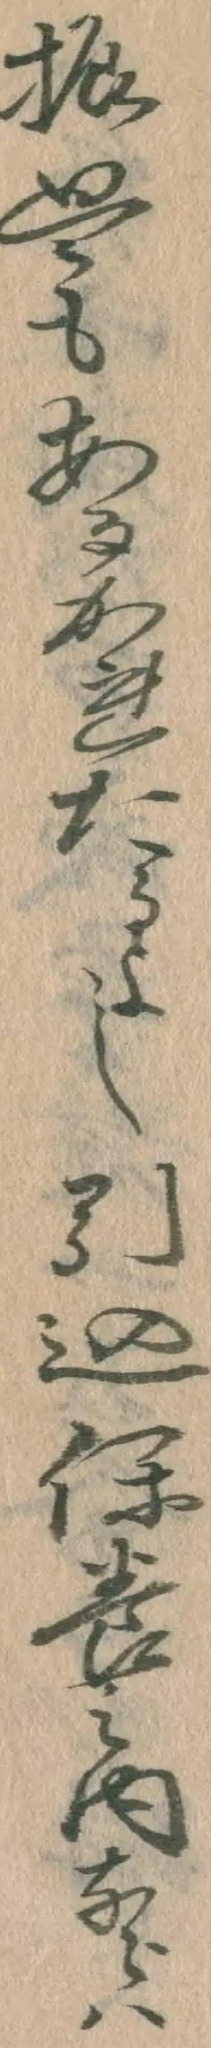振廻にもあるか連たるよし引込保養之内ならは
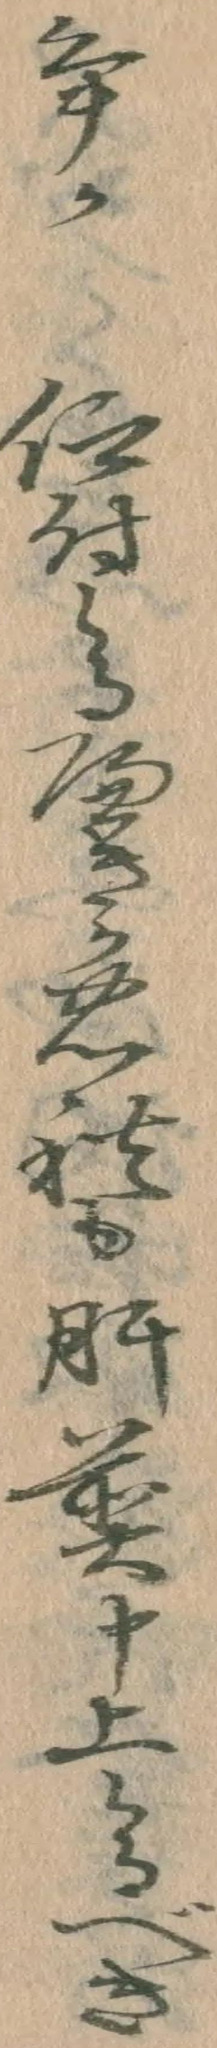争か仰付くる扁きか忠秋も肝煎申上らるべき
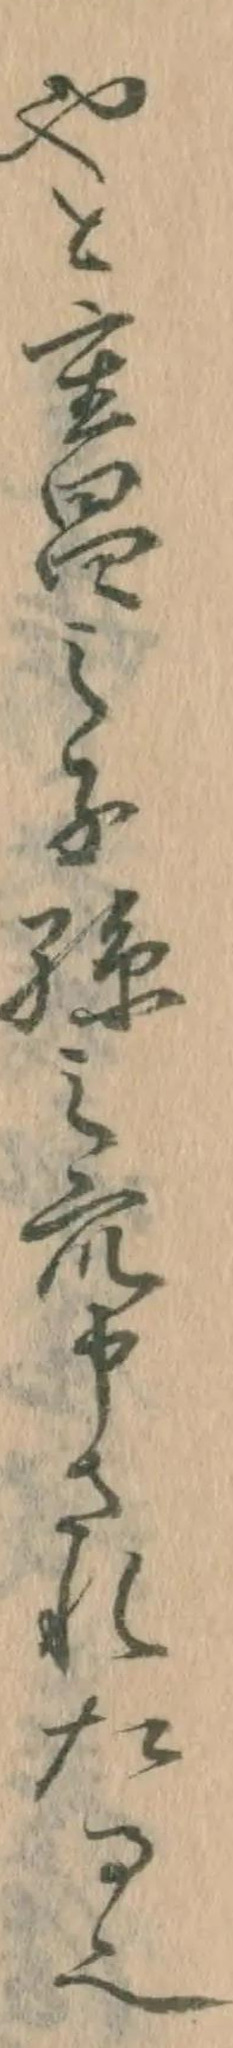やと重昌之子孫之衆申されたる也
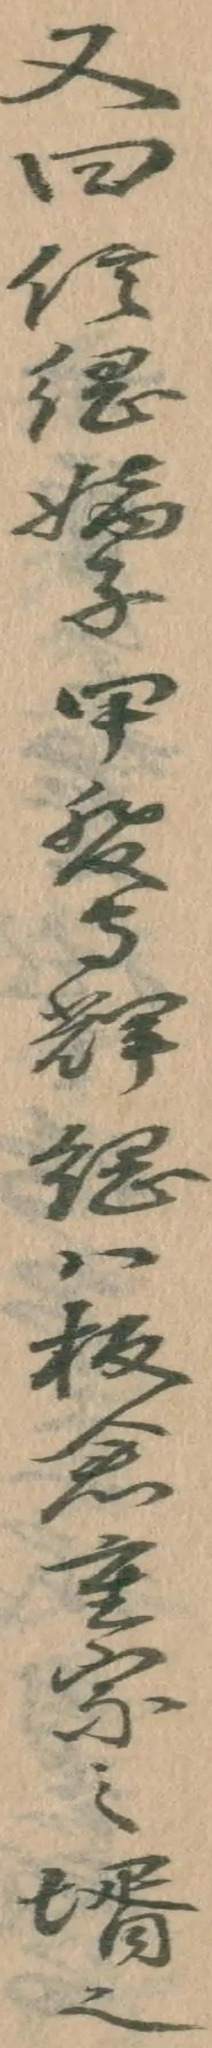又曰信綱嫡子甲発輝綱は板倉重家之壻也
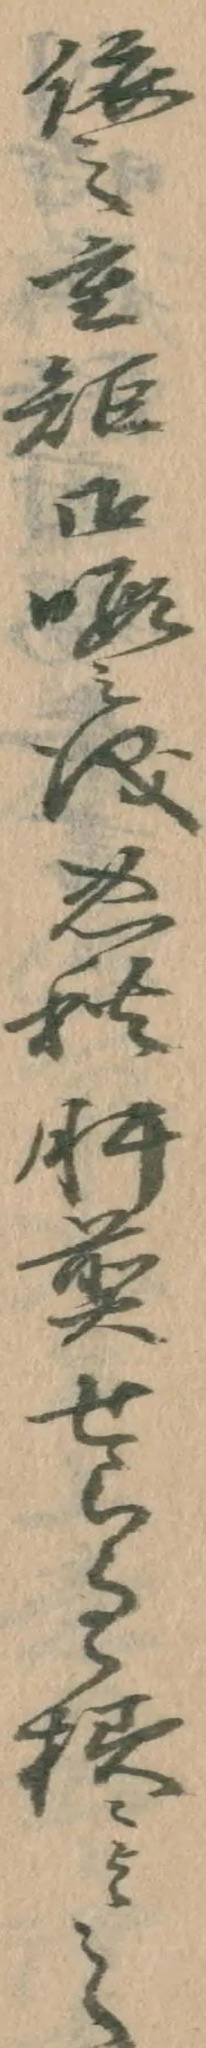依之重矩御暇之儀忠秋肝煎せらるゝ様に与之
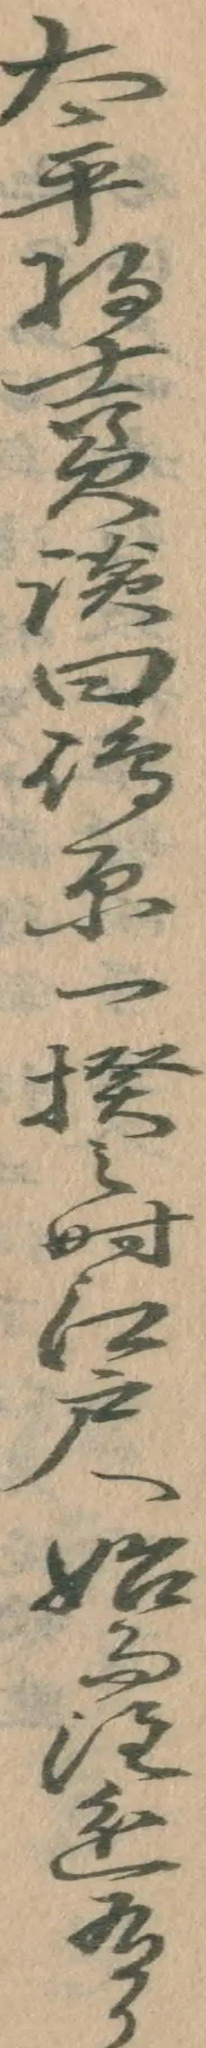太平将士美談曰島原一揆之時江戸へ始而注進有り
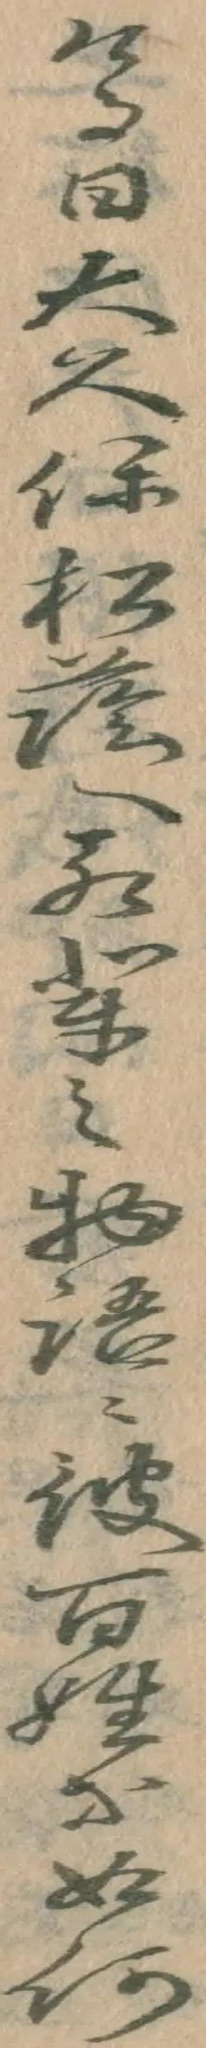ける日大久保松蔭へ若輩之物語に彼百姓等如何
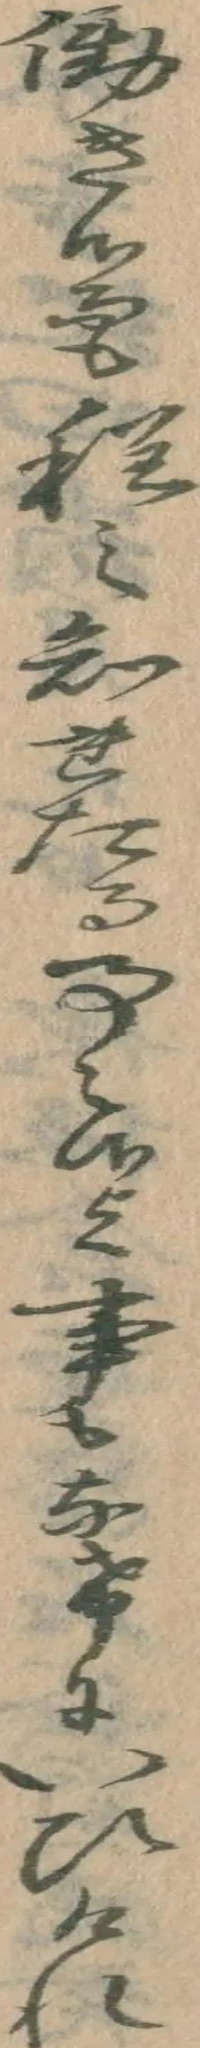働き候而も程之知連たる事に候与事もな希にいひけれ
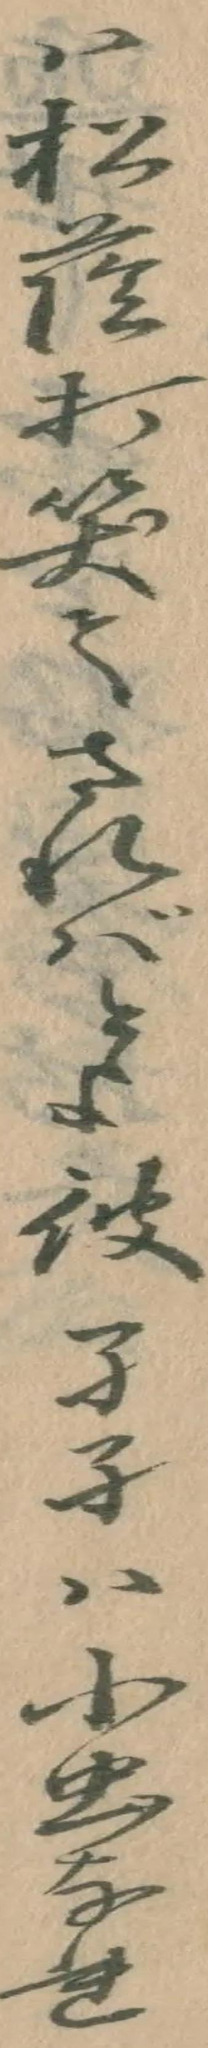は松蔭打笑てさればとよ彼子子は小虫なれ連
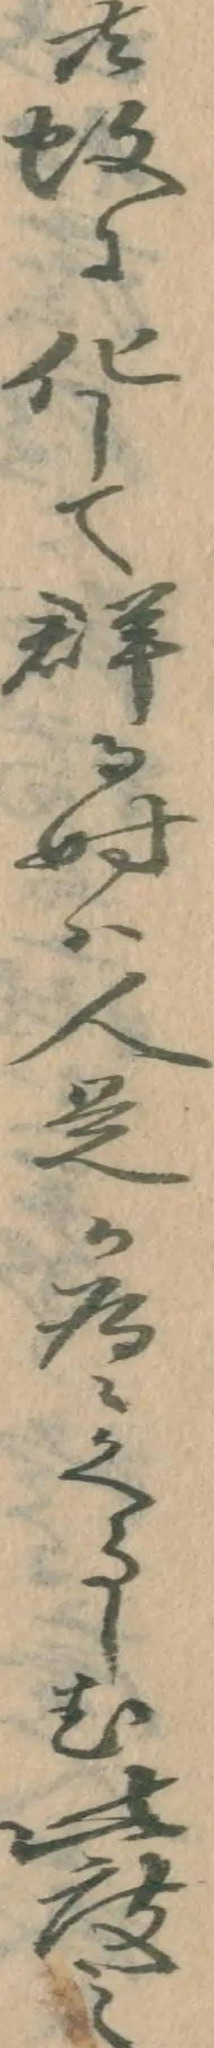共蚊尓化して群る時は人足か為にくるしむ此度之
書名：切支丹御退治記 49巻. [2]
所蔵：国立国会図書館 National Diet Library, JAPAN
